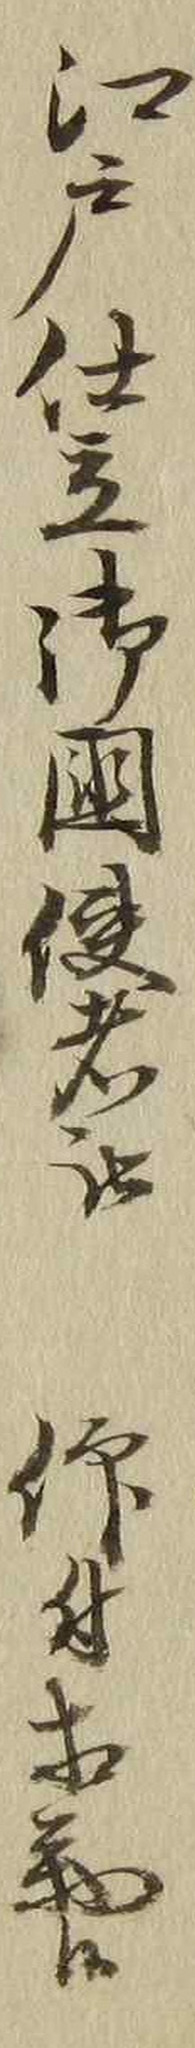江戸仕立御国使者被仰付相勤候
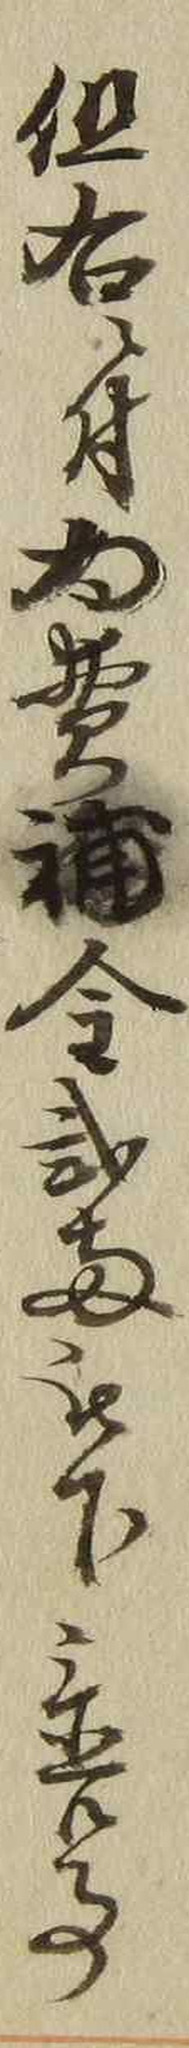但右ニ付為費補金弐両被下置候事
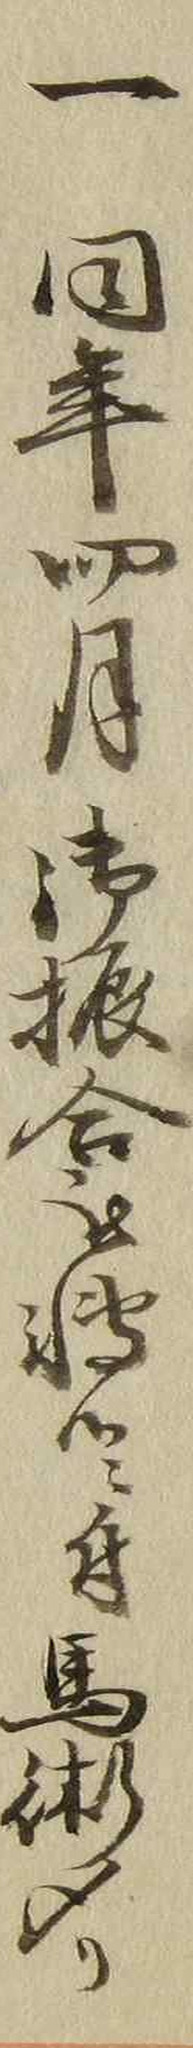一同年四月御振合被轉候ニ付馬術〆り
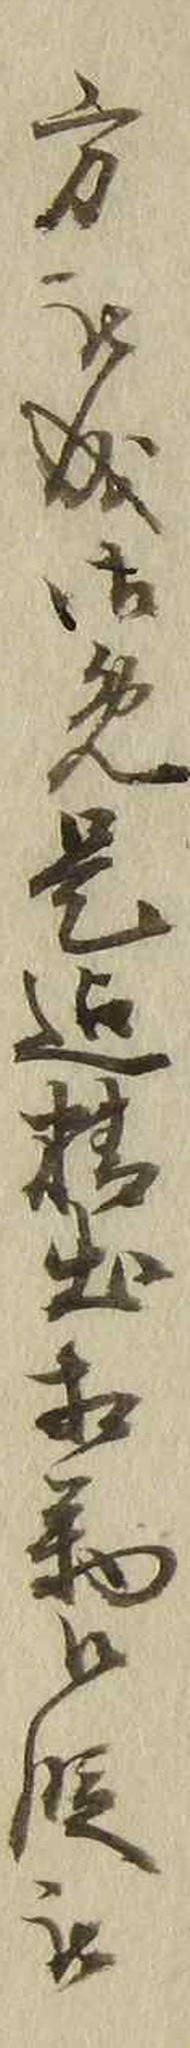方被成御免是迄精出相勤候段被
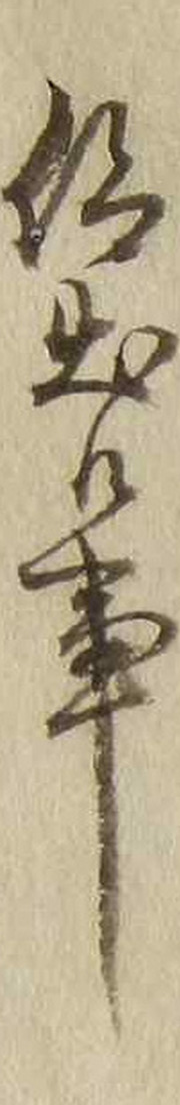仰出候事

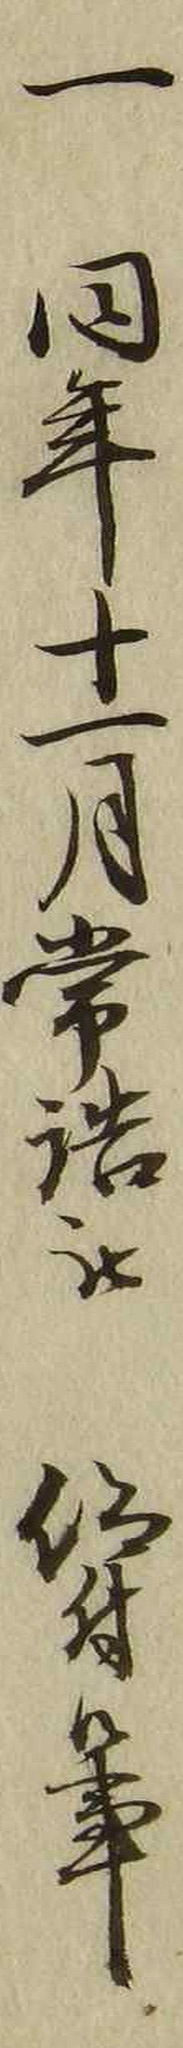一同年十一月常詰被仰付候事
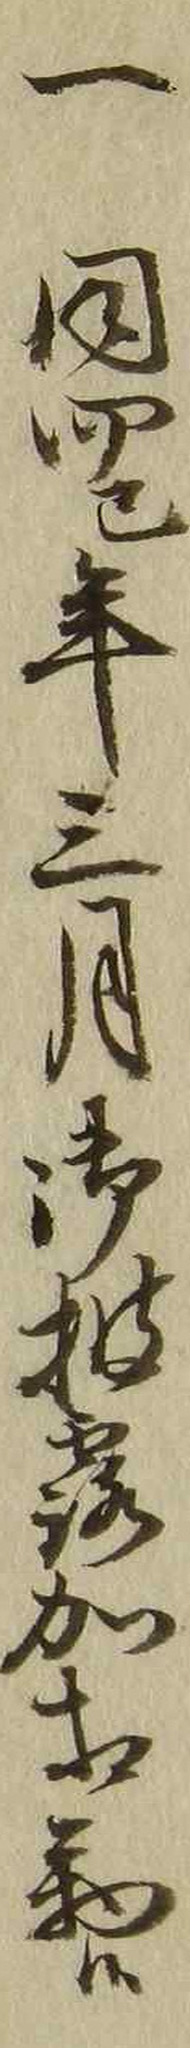一同四巳年三月御披露加相勤候
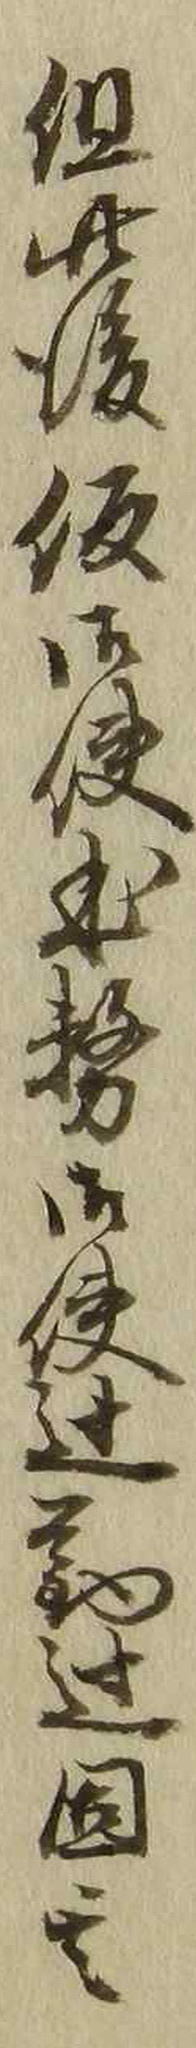但此後仮御使本務御使辻勤辻固其
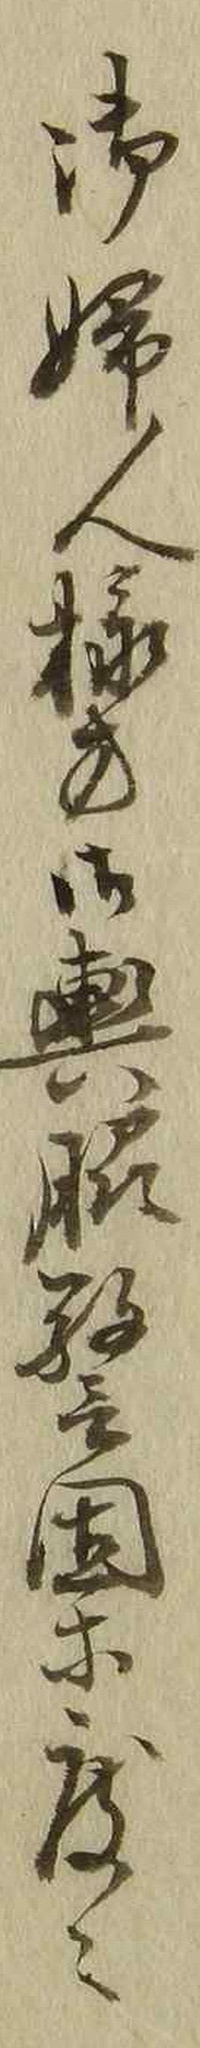御婦人様方御輿脇警固等度々
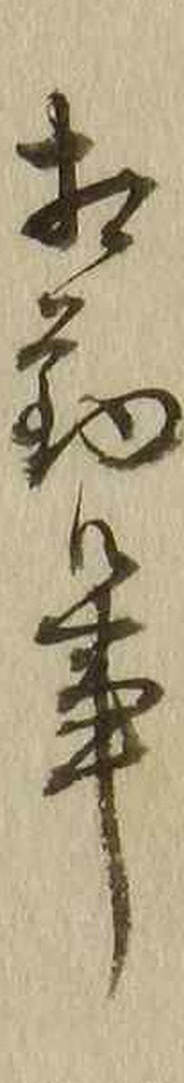相勤候事
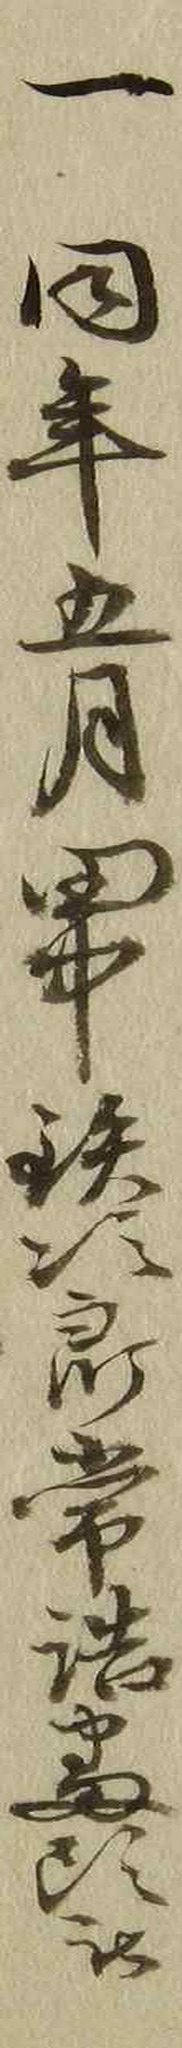一同年五月田中鉄次郎常詰番頭被
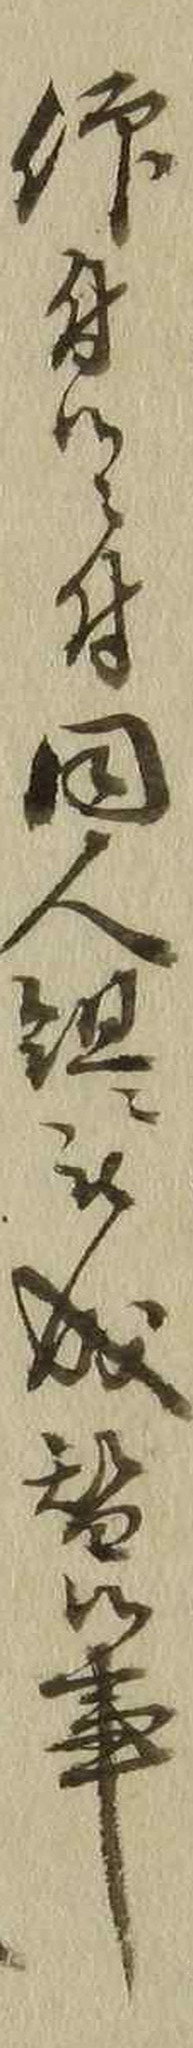仰付候ニ付同人組ニ被成替候事
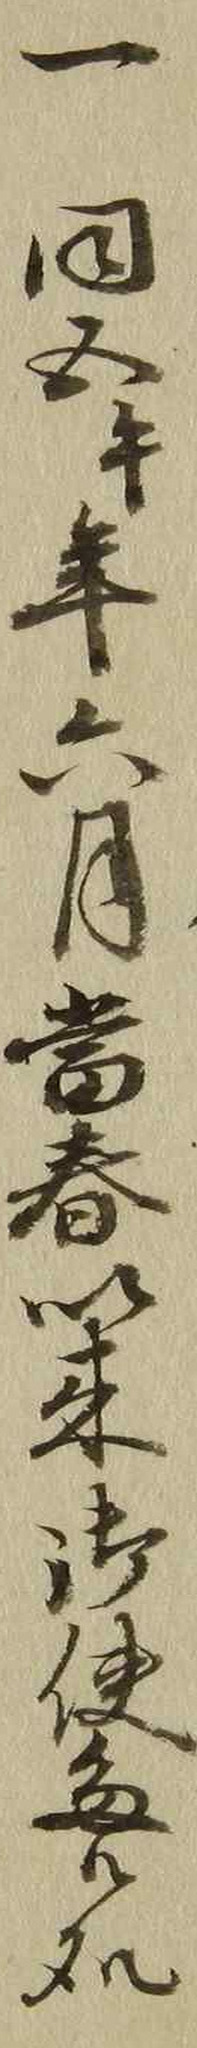一同五午年六月当春以来御使多候処
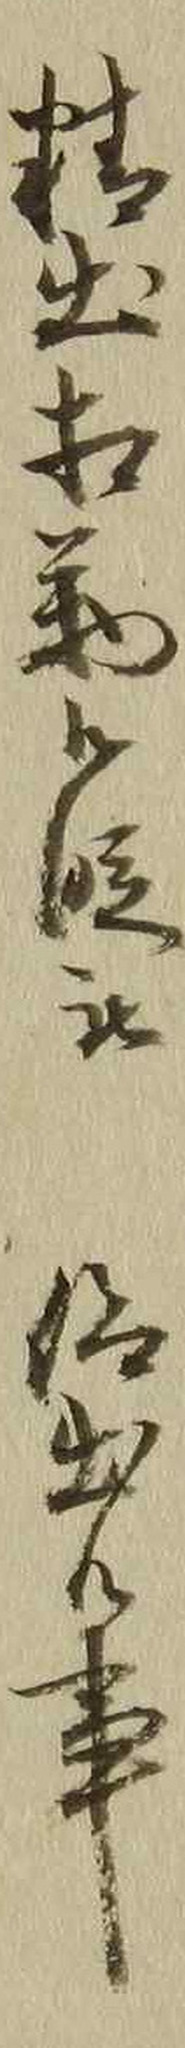精出相勤候段被仰出候事
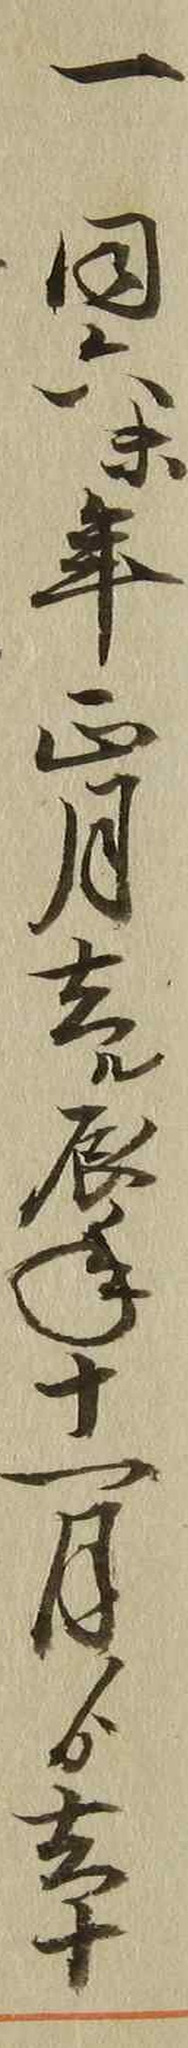一同六未年正月去ル辰年十一月ゟ去十
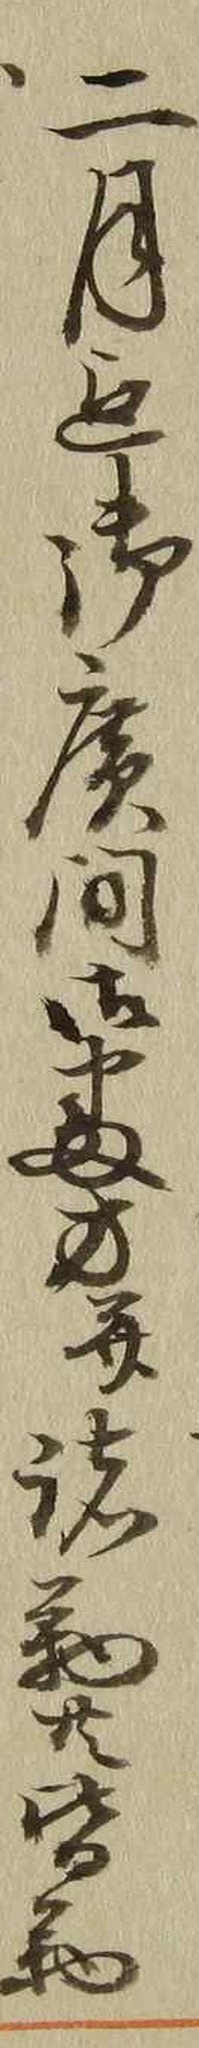二月迄御広間御番方幷諸勤共皆勤
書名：諸士系譜　巻之64　と之部7
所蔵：会津若松市立会津図書館
